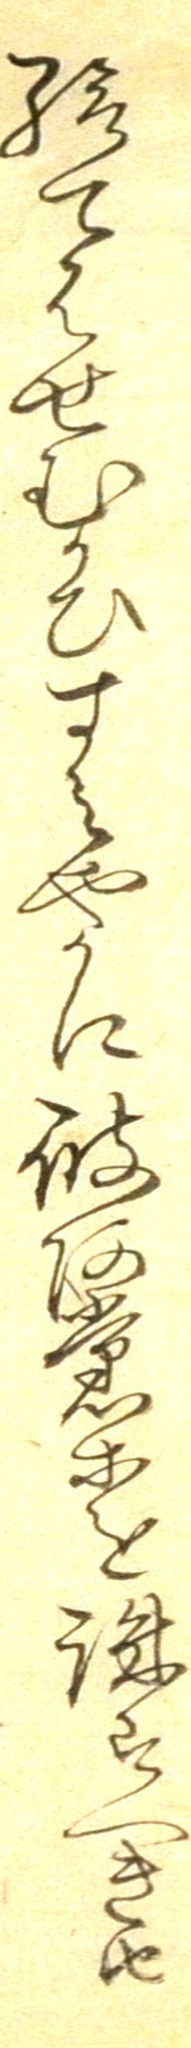給てはせむかひすみやかに彼何党等を誅すへき由
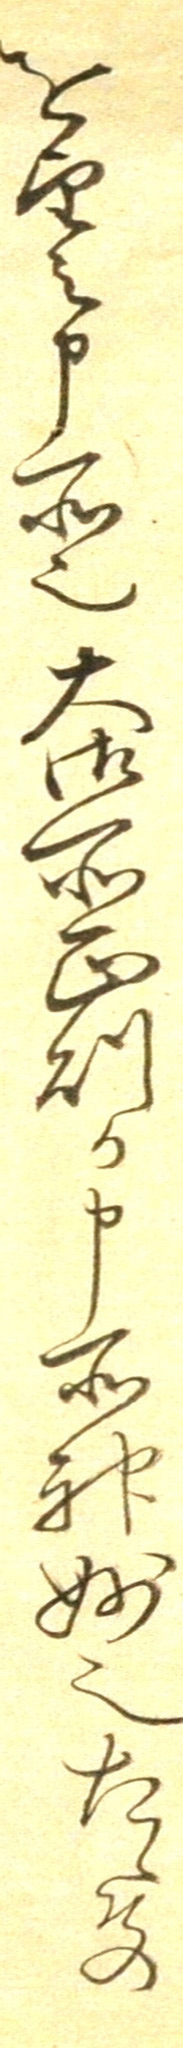を望み申所也大御所正則か申所神妙也たゝその
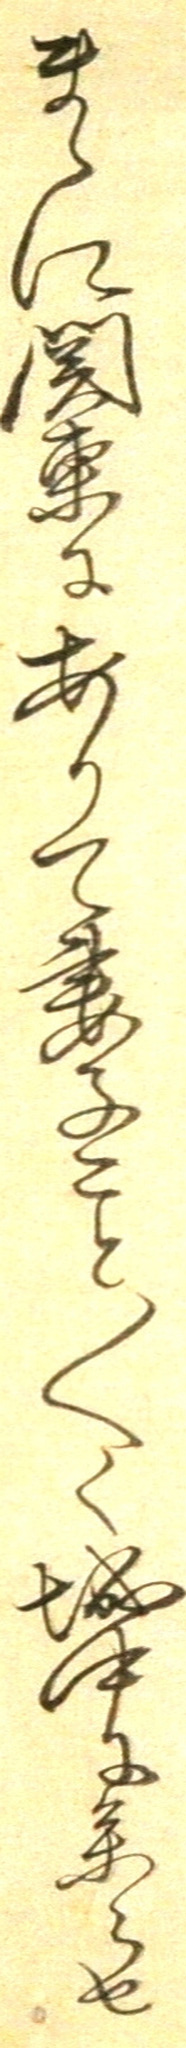まゝに関東にありて妻子こと〳〵く城中に参らせ
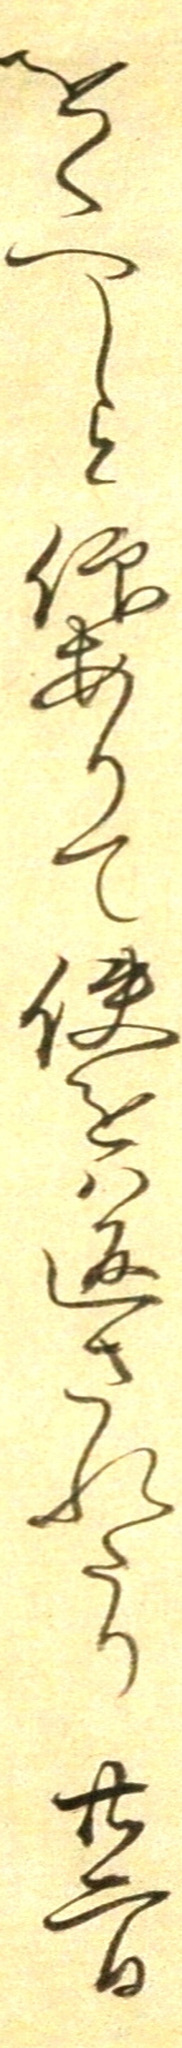をくへしと仰ありて使をは返されたり廿二日
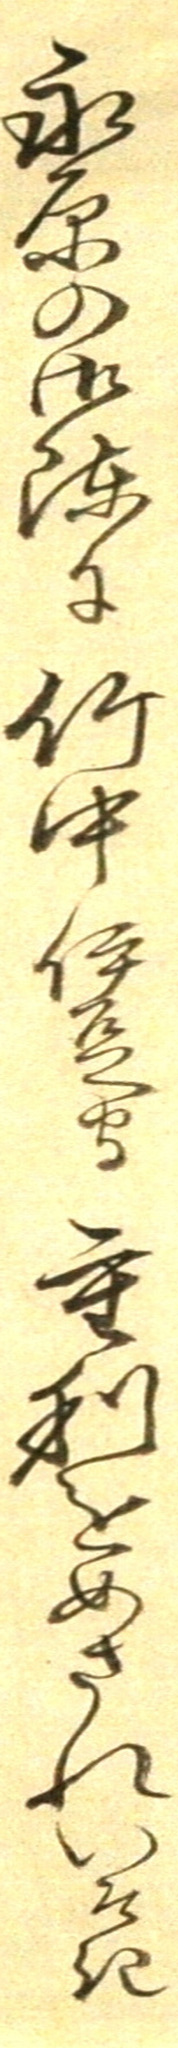永原の御陣に竹中伊豆守重利をめされいそき
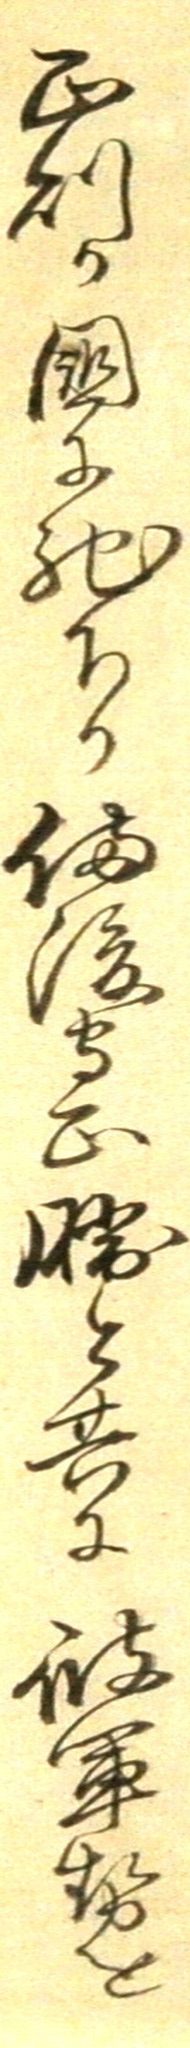正則か国に馳下り備後守正勝と共に彼軍勢を
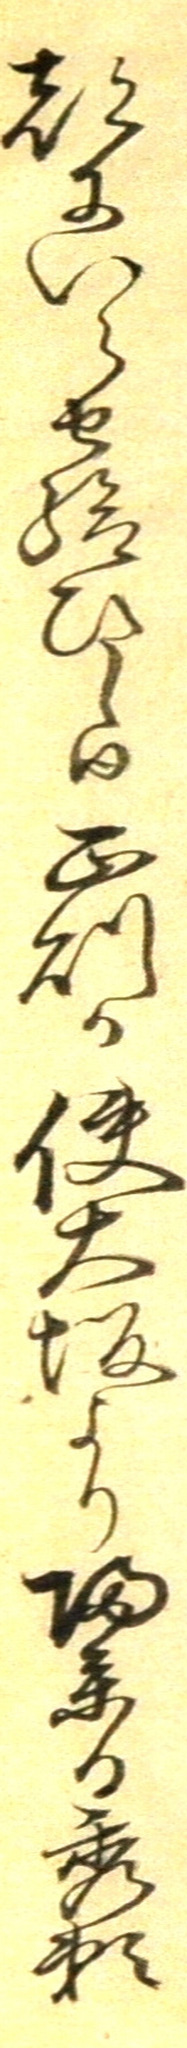都にいらせ給ひし日正則か使大坂より帰参る秀頼

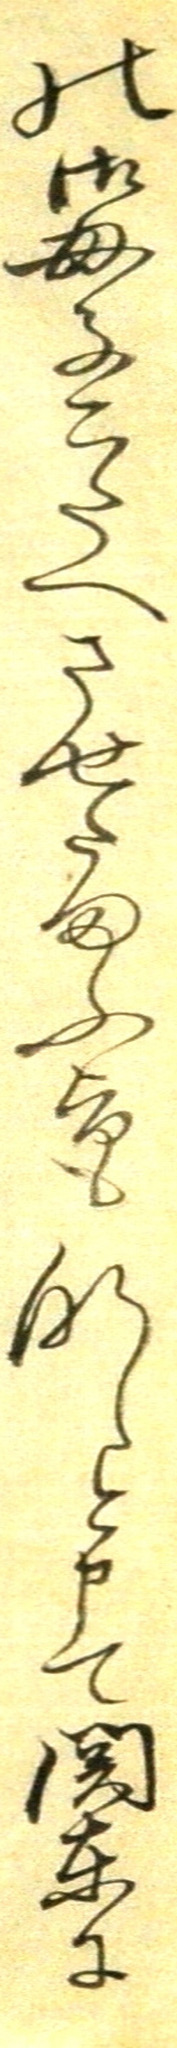の御母子こたへさせたまふ旨もなしと申て関東に
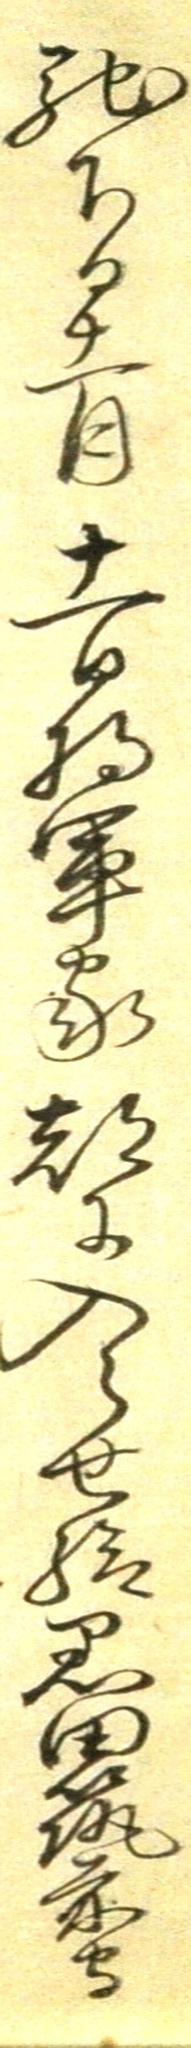馳下る十一月十一日将軍家都に入らせ給黒田筑前守
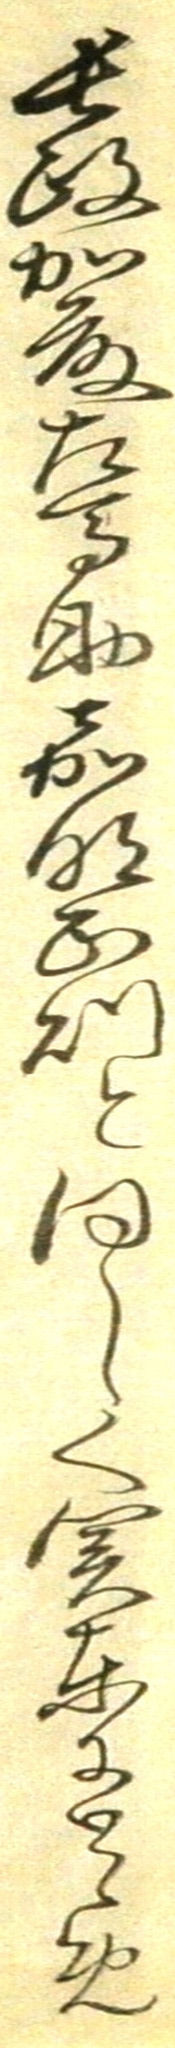長政加藤左馬助嘉明正則と同しく関東にと〲ゝめ
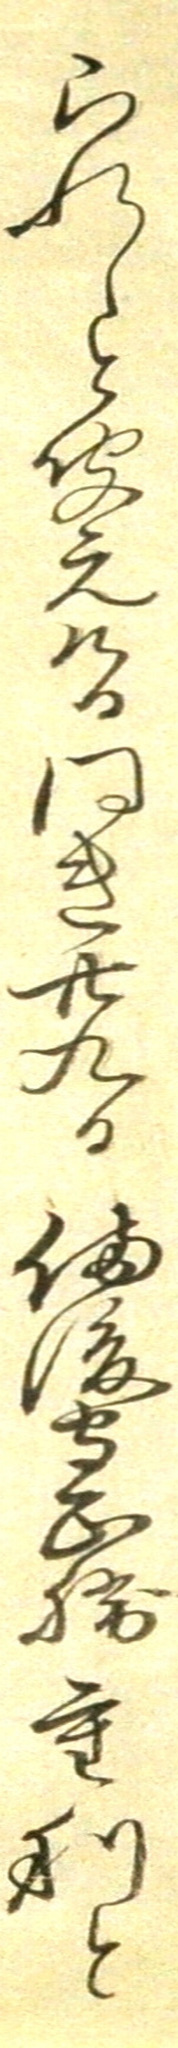られしと聞えける同き廿九日備後守正勝重利と
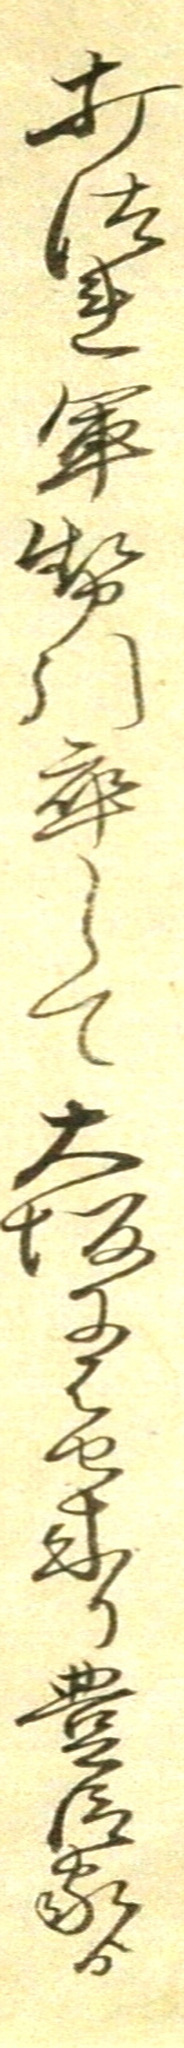打つれ軍勢引卒して大坂にはせ来り豊臣家ゟ
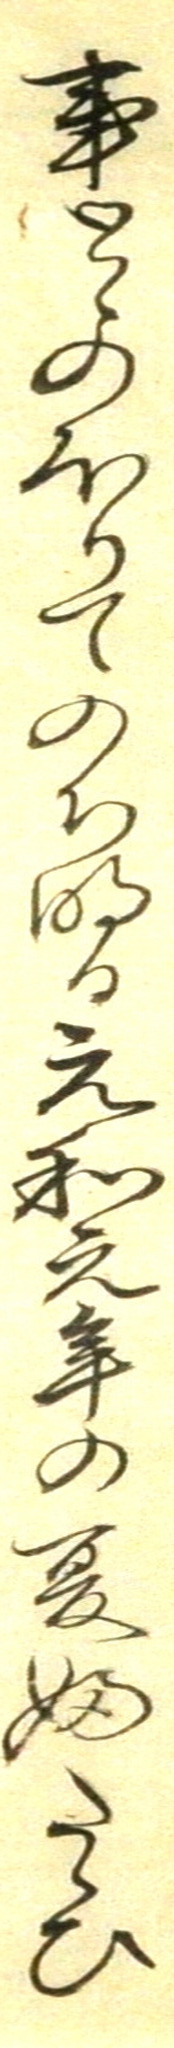事とゝのほりてのち明日元和元年の夏ふたゝひ
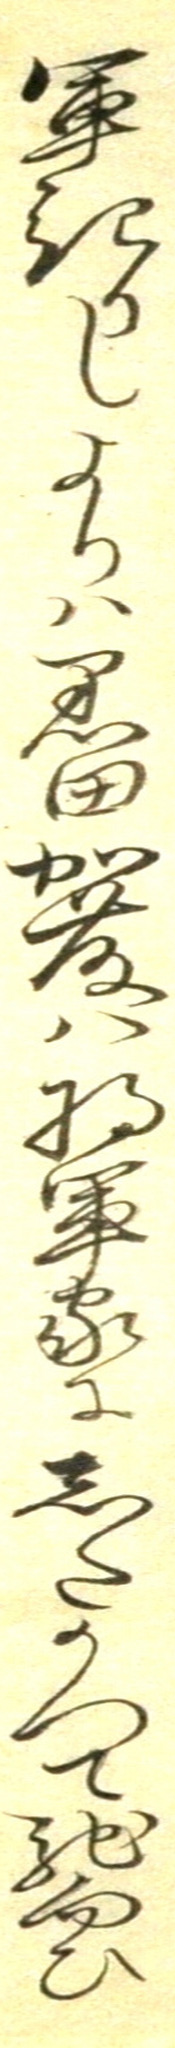軍起りしよりは黒田加藤は将軍家にしたかつて馳向ひ
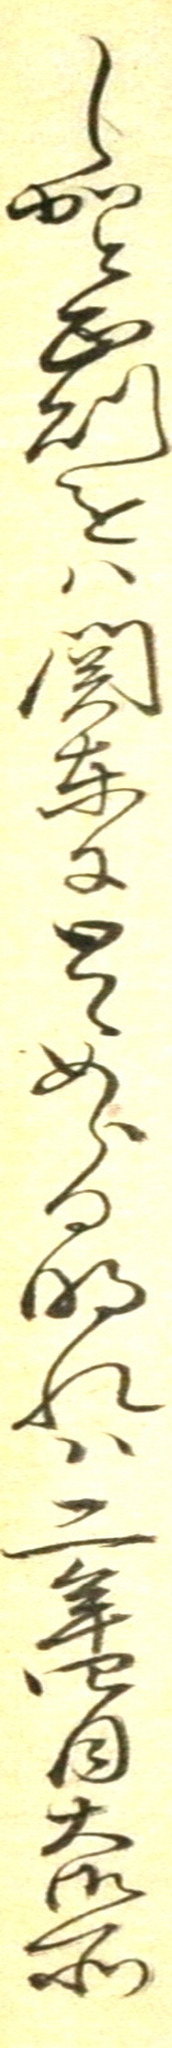しかと正則をは関東にとゝめらる明れは二年四月大御所
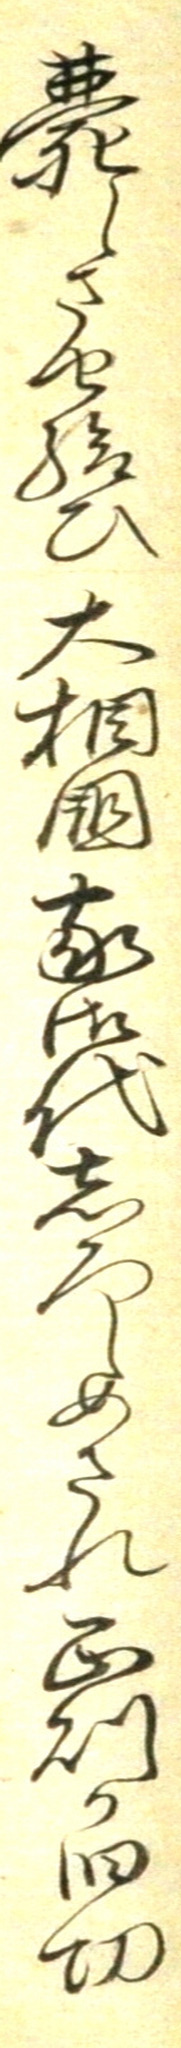薨しさせ給ひ大相国家御代しろしめされ正則か旧功
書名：藩翰譜（十二・上）
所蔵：伊那市立高遠町図書館・合同会社AMANE
